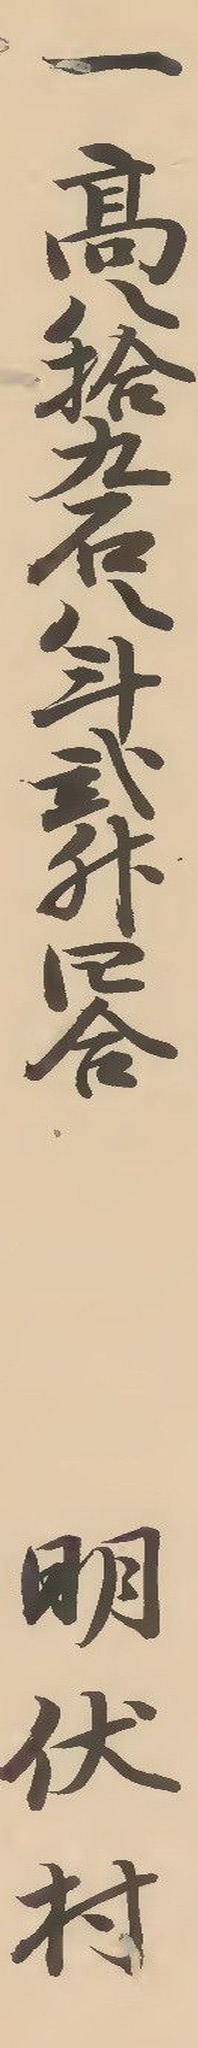一高八拾九石八斗弐升四合明伏村
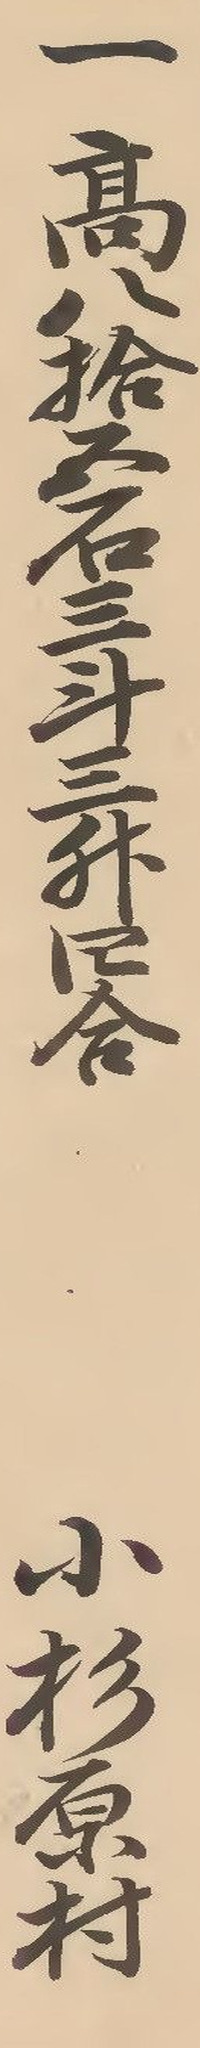一高八拾五石三斗三升四合小杉原村
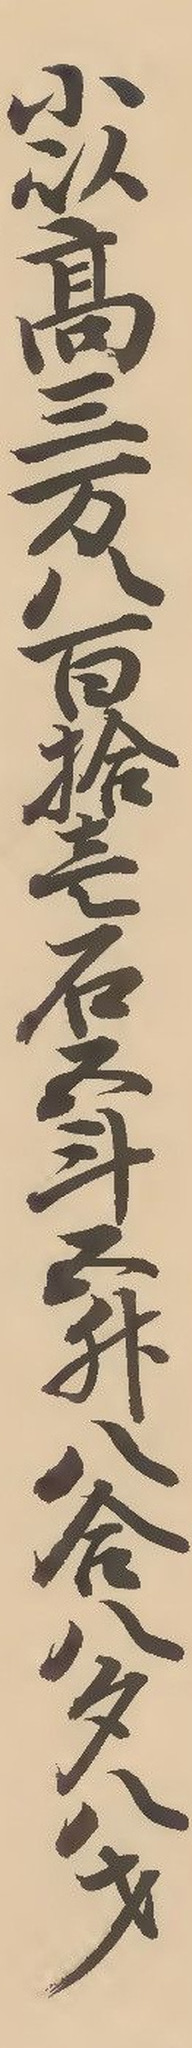小以高三万八百拾壱石五斗五升八合八勺八才

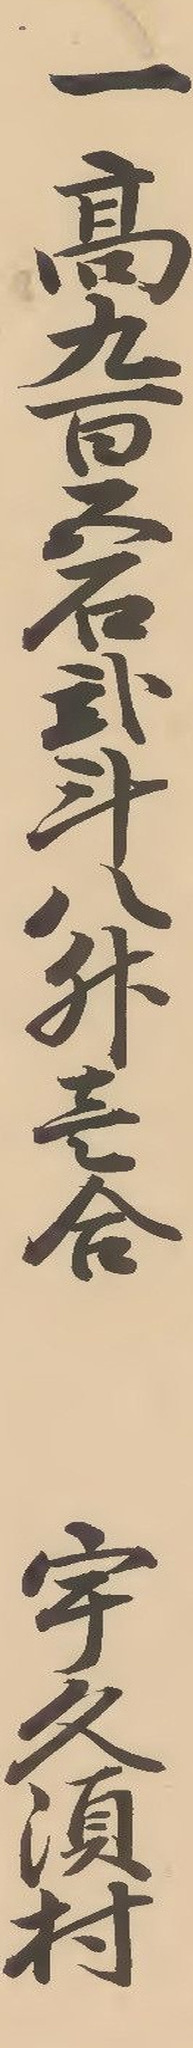一高九百五石弐斗八升壱合宇久須村
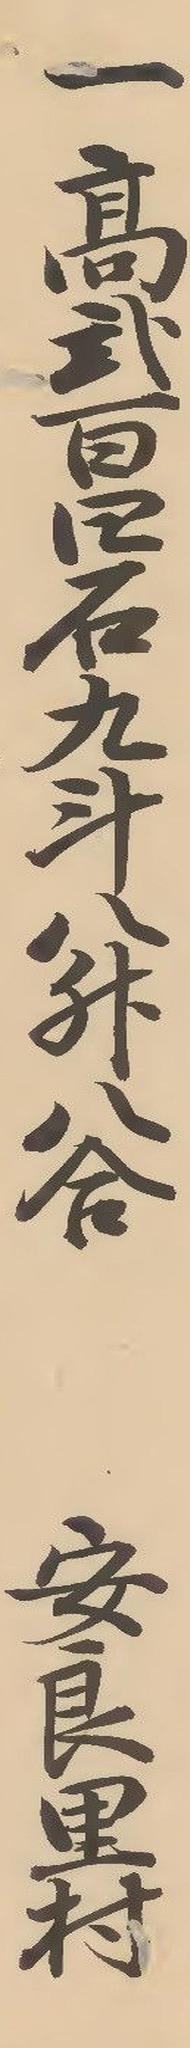一高弐百四石九斗八升八合安良里村
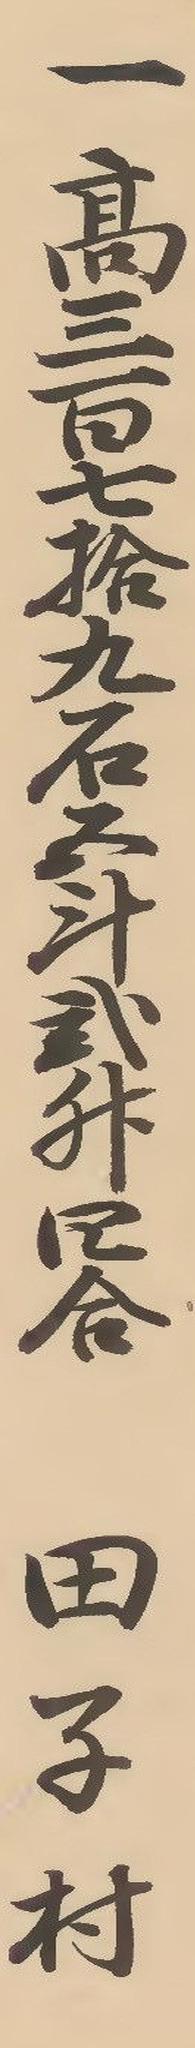一高三百七拾九石五斗弐升四合田子村
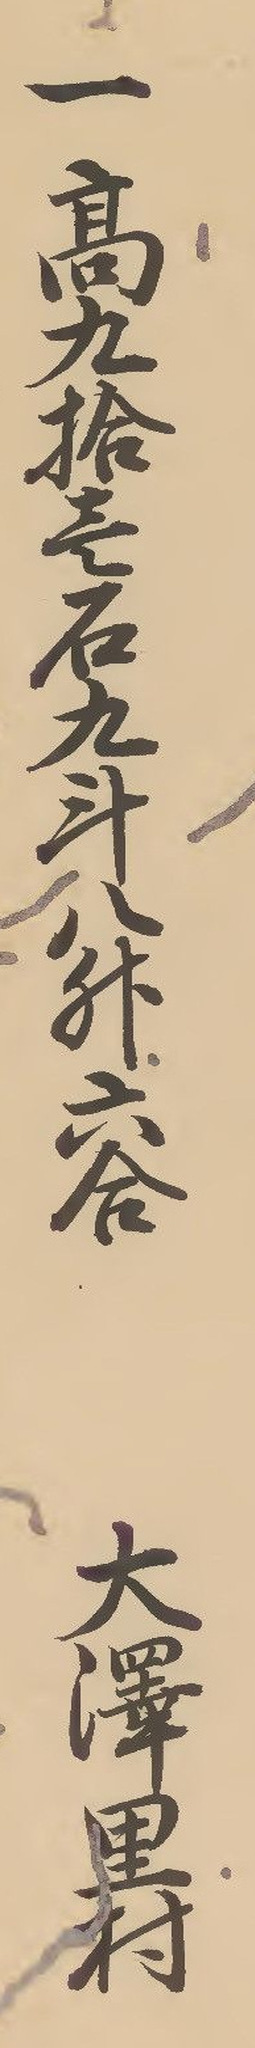一高九拾壱石九斗八升六合大沢里村

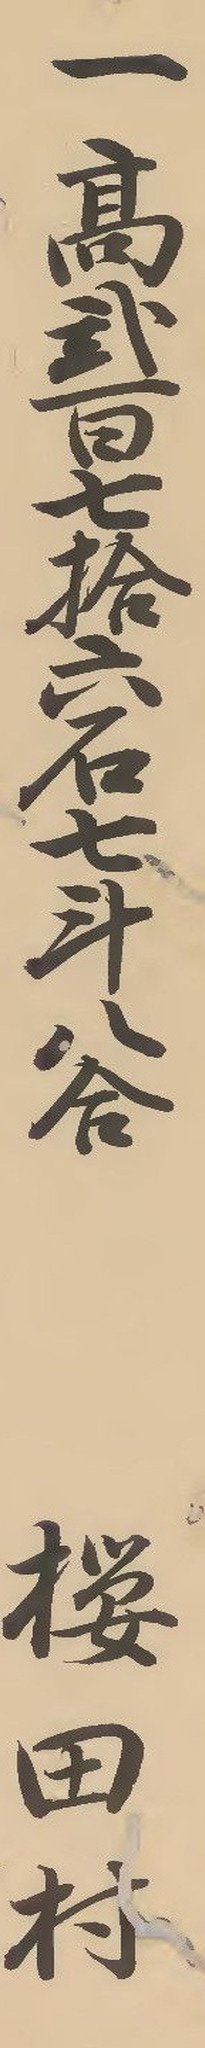一高弐百七拾六石七斗八合桜田村
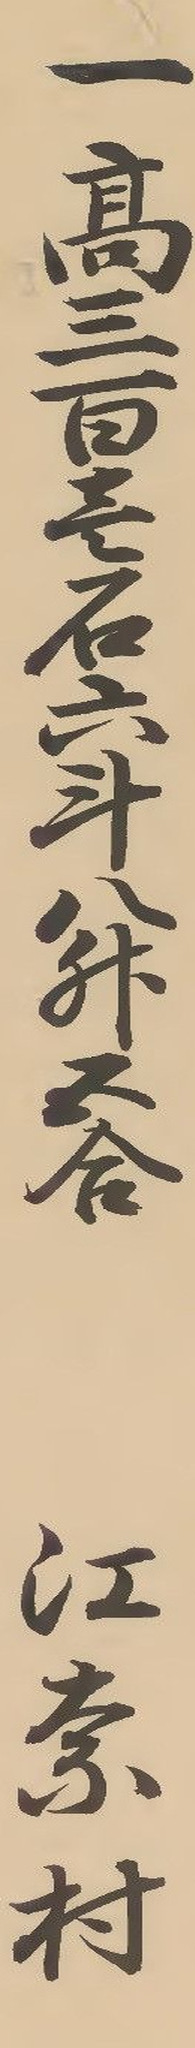一高三百壱石六斗八升五合江奈村
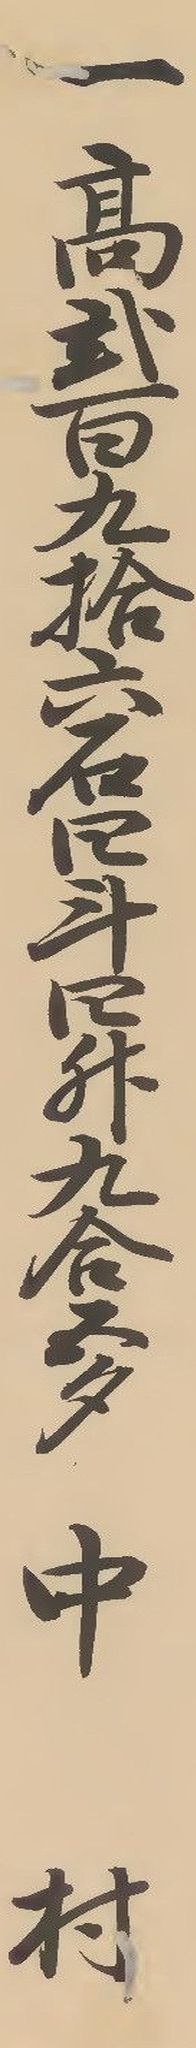一高弐百九拾六石四斗四升九合五勺中村
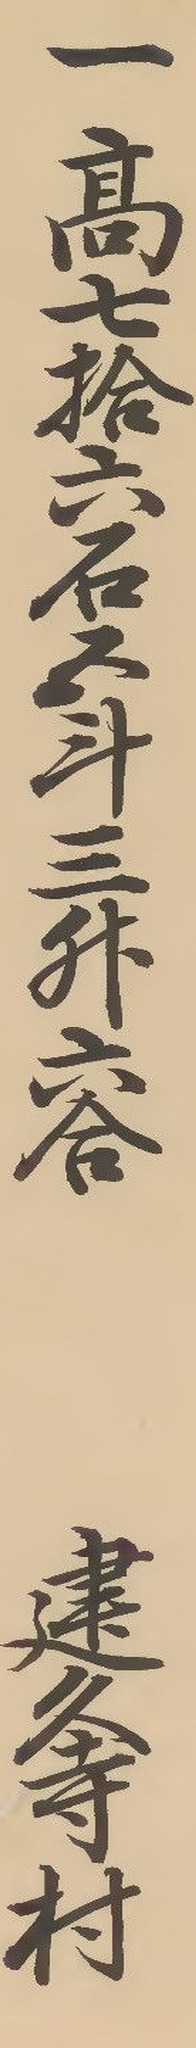一高七拾六石五斗三升六合建久寺村
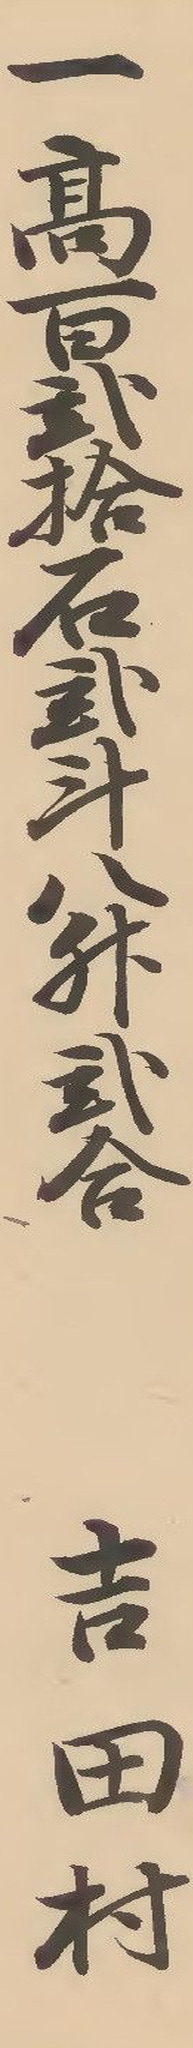一高百弐拾石弐斗八升弐合吉田村
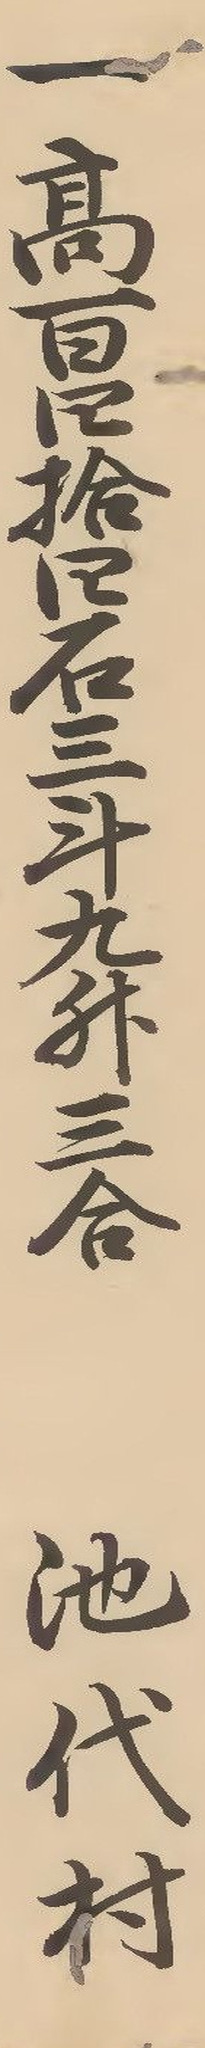一高百四拾四石三斗九升三合池代村
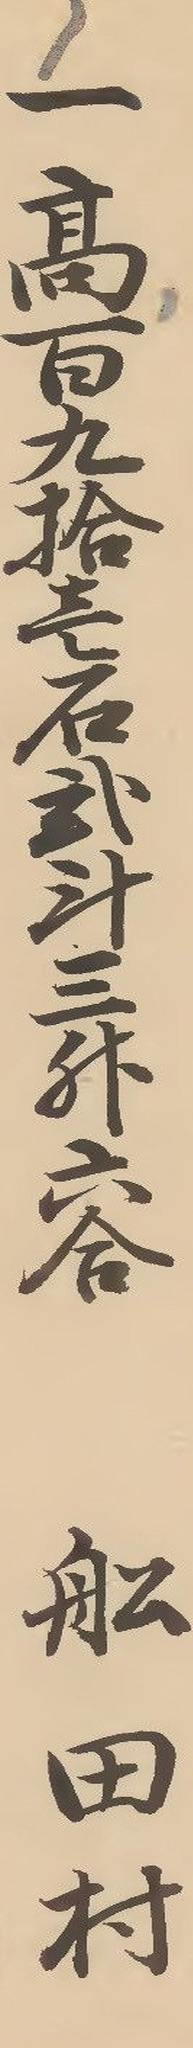一高百九拾壱石弐斗三升六合船田村
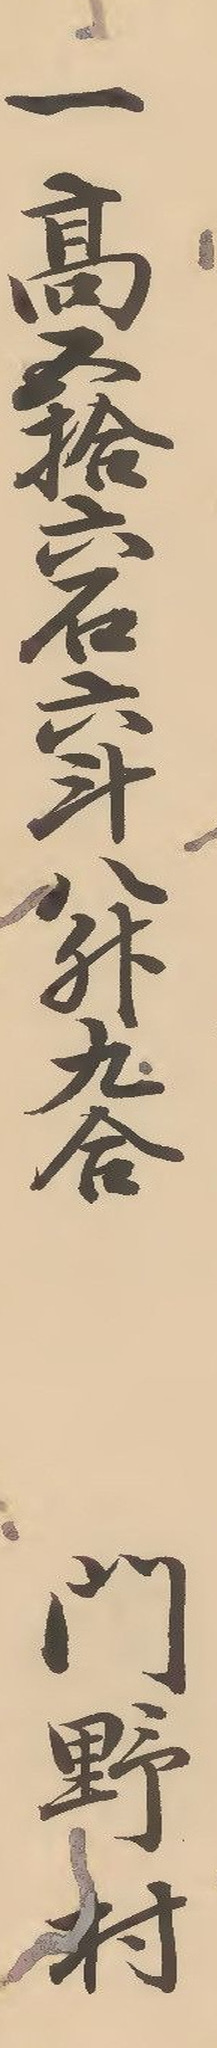一高五拾六石六斗八升九合門野村

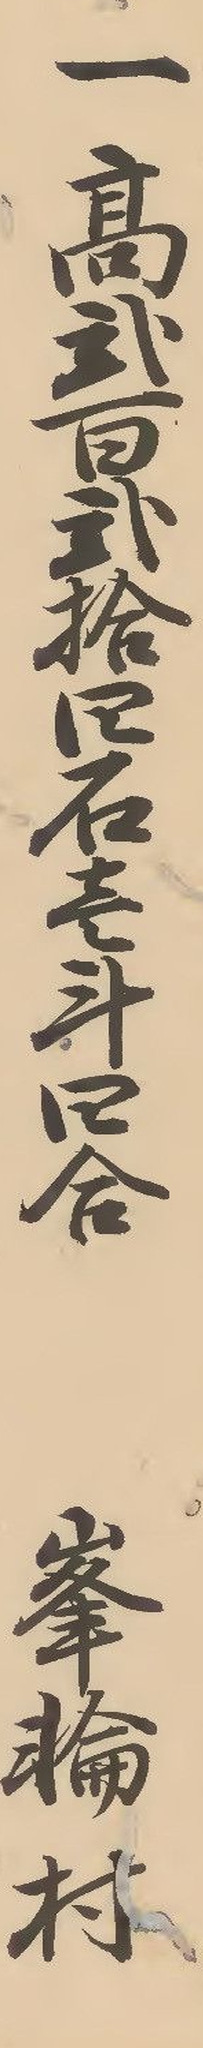一高弐百弐拾四石壱斗四合峰輪村
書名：伊豆国郷帳
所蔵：国立公文書館 National Archives of Japan
